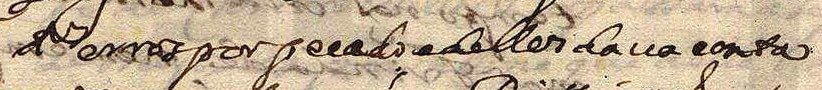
d̄os erros por pecado, e delles daua conta
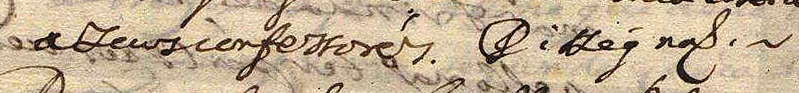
a seus confessores. Disse q̄ naõ.
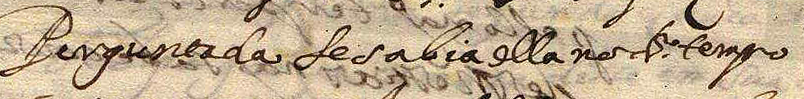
Perguntada se sabia ella no d̄.o tempo
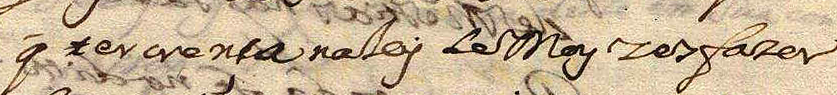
ter crença na Ley de Moyzes fazer
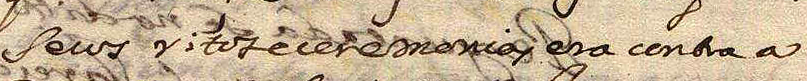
seus ritos e ceremonias era contra a
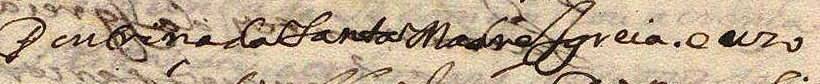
Doutrina da Santa Madre Jgreia, e uzo
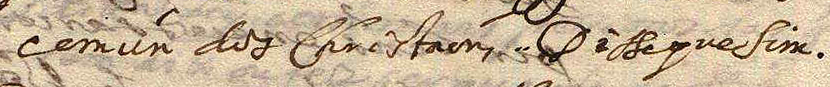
comum dos Christaons. Disse que Sim.
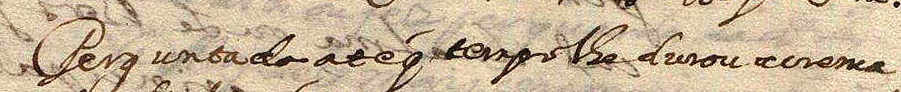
Perguntada ate q̄ tempo lhe durou a crença
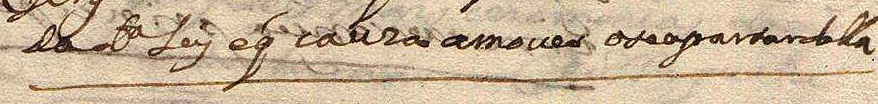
da d̄a Ley e q̄ cauza a moueo a se apartar della
